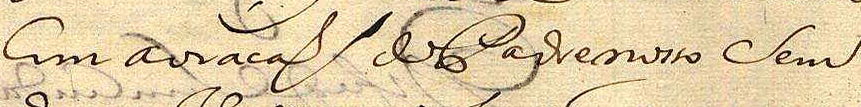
Com a oraçaõ do Padre nosso Sem
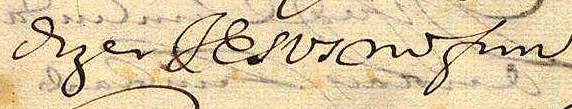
dizer IEsvs no fim
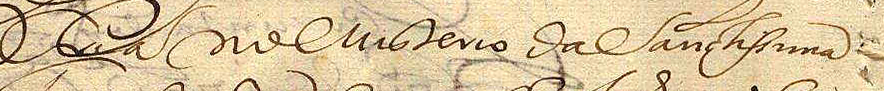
Cria no Misterio da Sanctissima
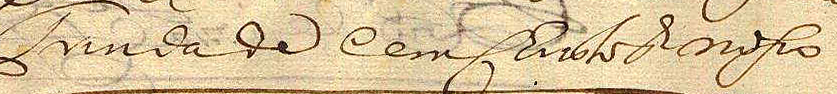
Trindade e em Christo sor nosso
